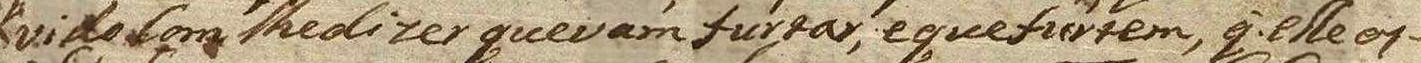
vido Com lhe dizer que vam furtar, e que furtem, q̄ elle os
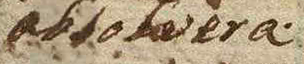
absoLvera.
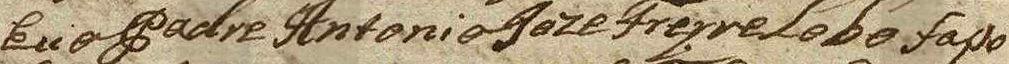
Eu o Padre Antonio Joze Freyre Lobo fasso
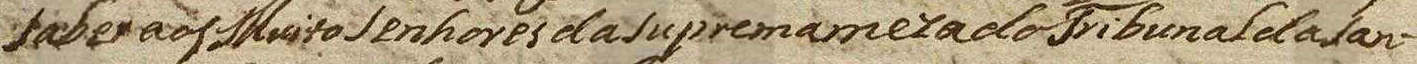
saber aos Muitos senhores da suprema meza do TribunaL da san
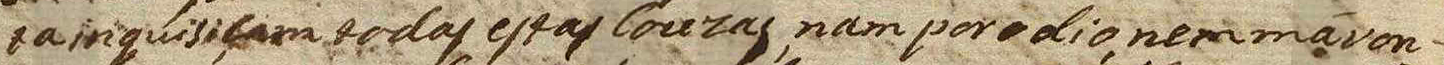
ta inquisiçam todas estas Couzas, nem por odio, nem má von
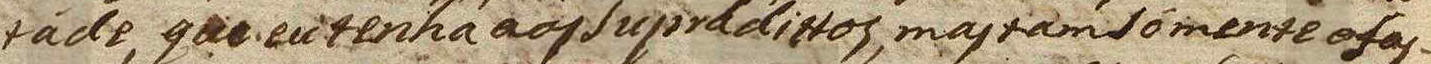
táde, que eu tenha aos supradittos, mas tam sómente o fas
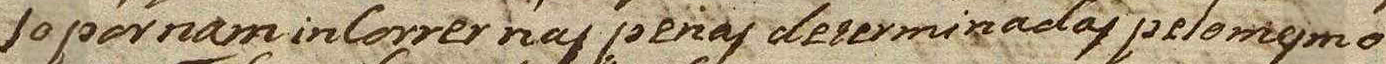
so por nam inCorrer nas penas determinadas pelo mesmo
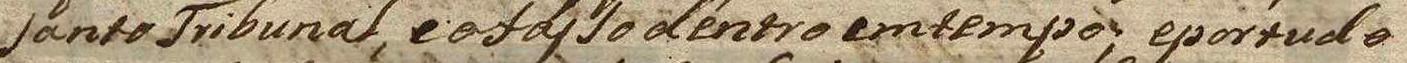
Santo Tribunal, e o fasso dentro em tempo, e por tudo
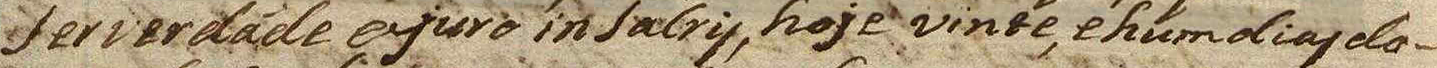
ser verdade o juro in SaCris, hoje vinte, e hum dias do
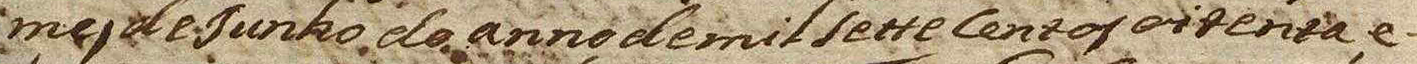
mes de Junho do anno de miL setteCentos oitenta, e
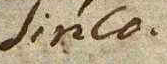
sinco.
